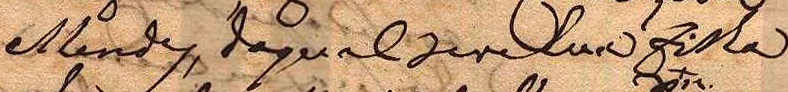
Mendes, da qual teve hua filha
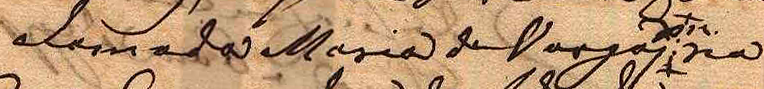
chamada Maria de Vargas. x. n. na
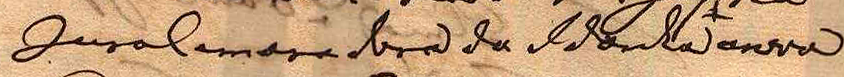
tural e moradora da Idanha a nova
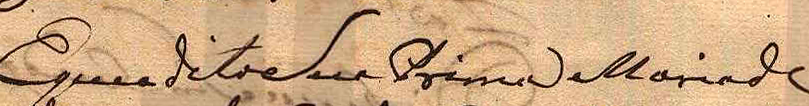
E que a dito Sua Prima Maria de
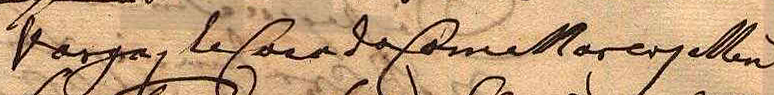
Vargas he Cazada Com Marcos Men
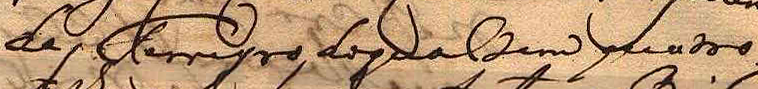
des Ferreyro do qual tem quatro
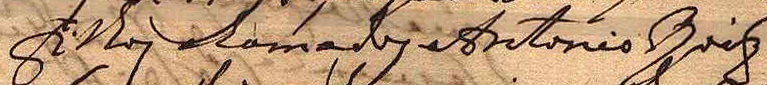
filhos chamados Antonio Roiz̄
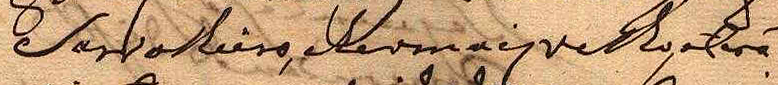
Sarralheiro, e he o mais velho e terá
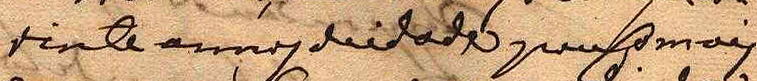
vinte annos de idade pouCo mais
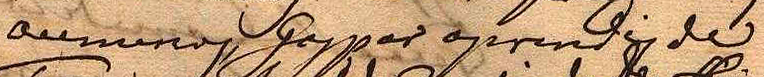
ou menos, Gaspar aprendis de
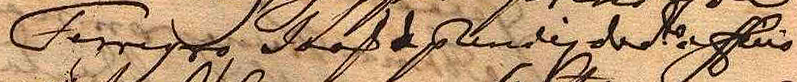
Ferreyro, Ioaõ apRendis do d.to officio
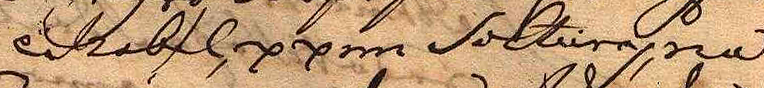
e Izabel, xx nn solteiros, na
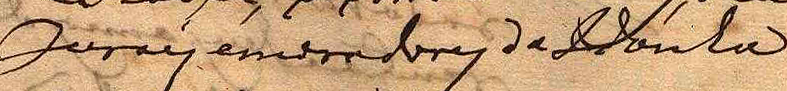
turais e moradores da Idanha
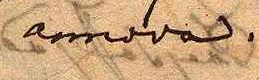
a nnova.
